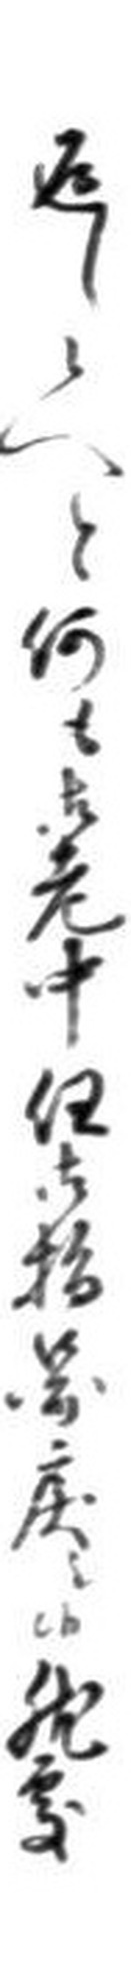返し候へと何も御老中任御指図戻シ候然處

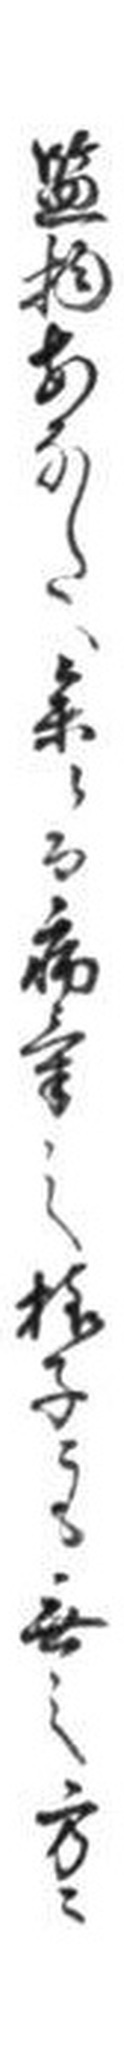監物あなたへ参候而病気之様子ニも無之方ニ
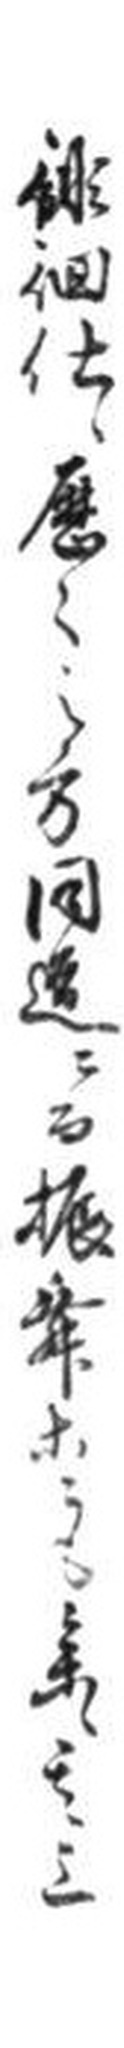徘徊仕候歴々之方同道ニ而振舞等ニも参候其上
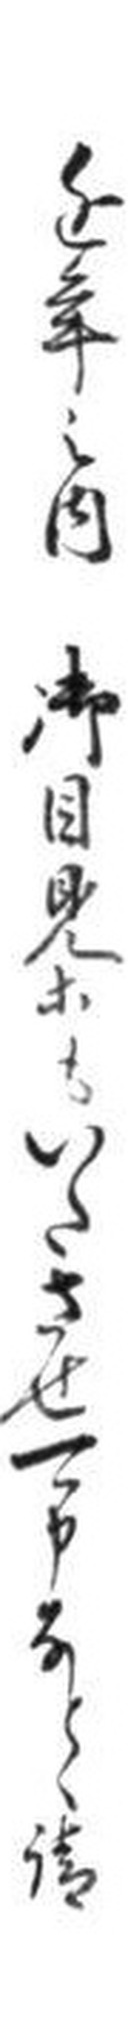近年之内御目見等もいたさせ可申なとヽ請
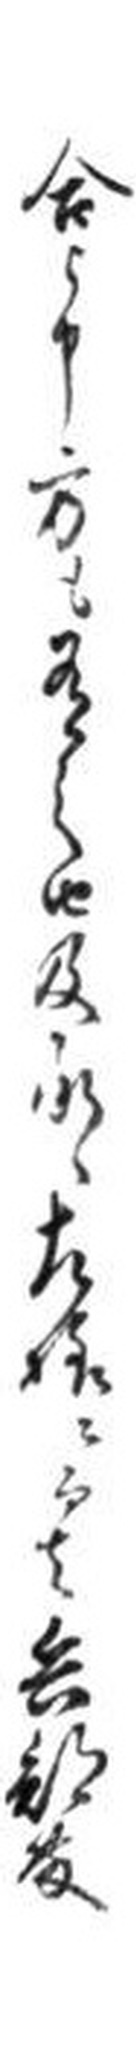合被申方も有之由及承候左様ニ而者兵部殿
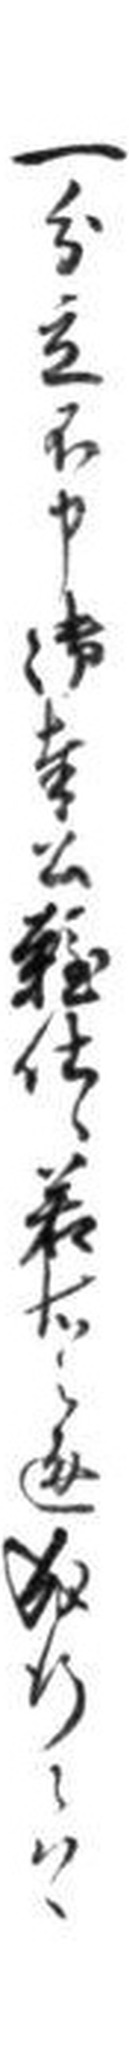一分立不申御奉公難仕候若右之通成行候ハヽ
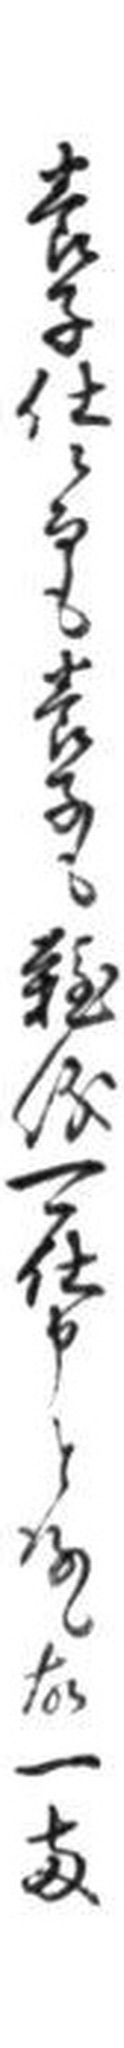養子仕候而も養子も難儀可仕申と存候故一両
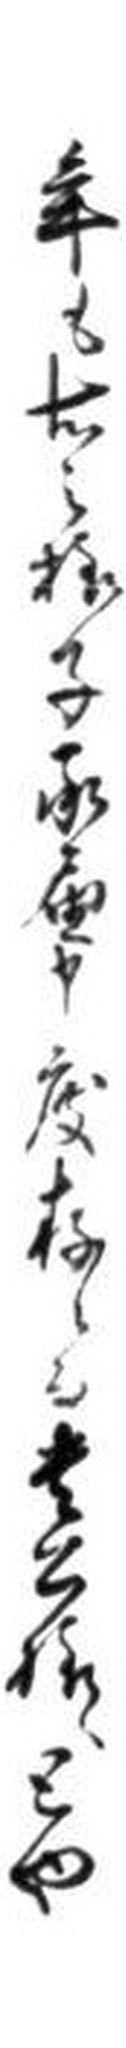年も右之様子承届申度存候而貴公様へとや
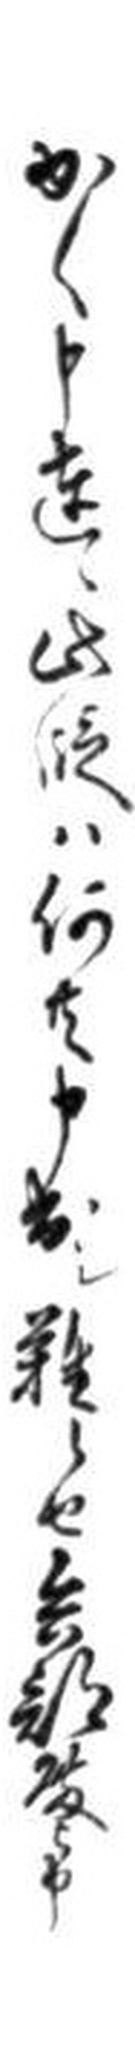かく申達候此段ハ何共申出シ難候由兵部殿被申
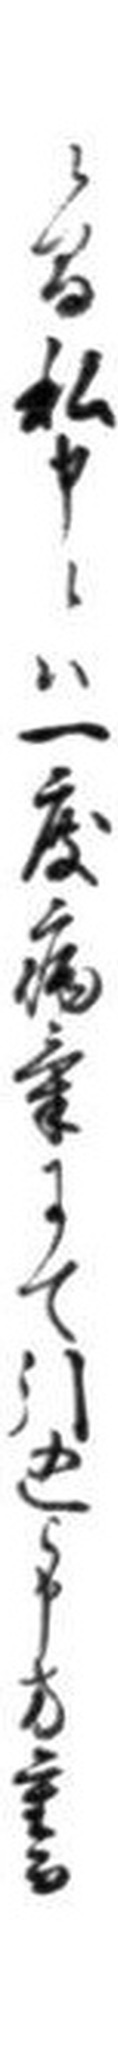候間私申候ハ一度病気にて引込被申方重而
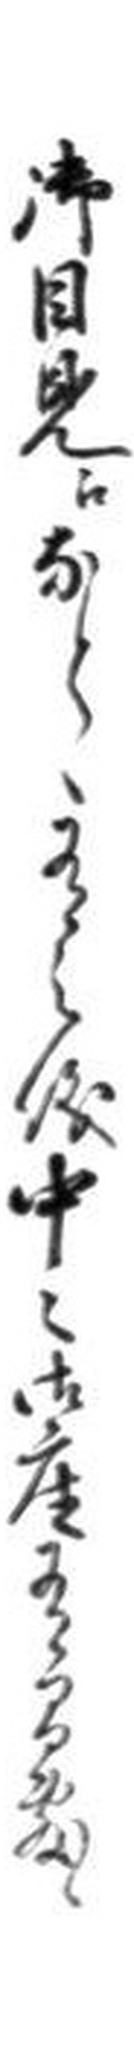御目見江なとヽ有之儀中々御座有間敷候
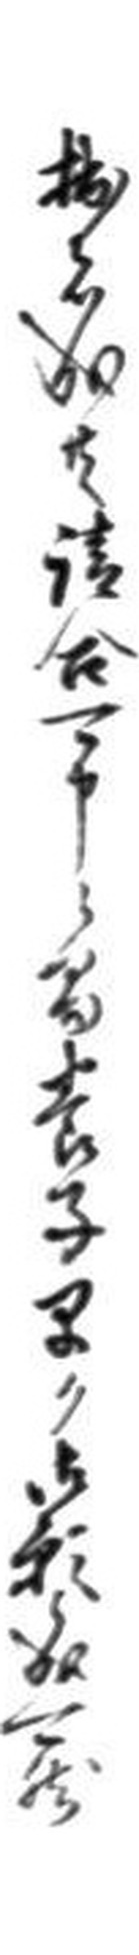拙者成共請合可申候間養子早ク御願被成可然
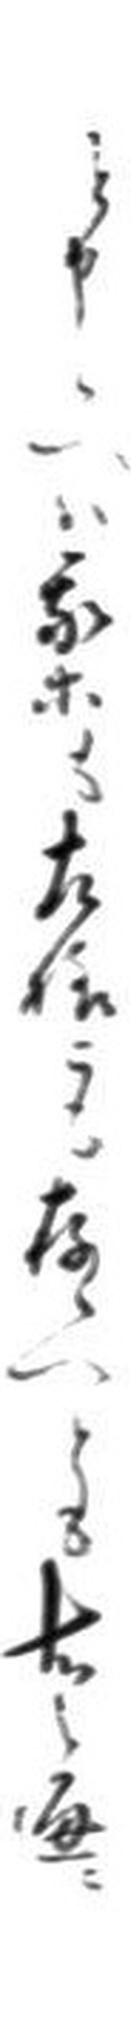と申候へハ我等も左様二も存候へとも右之通ニ
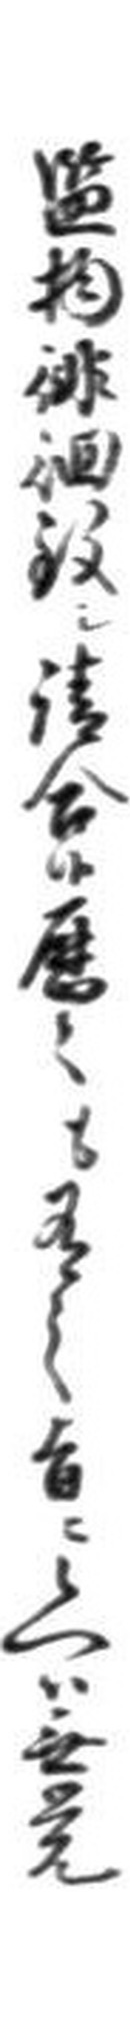監物徘徊致シ請合候歴々も有之旨ニ候へハ無覚
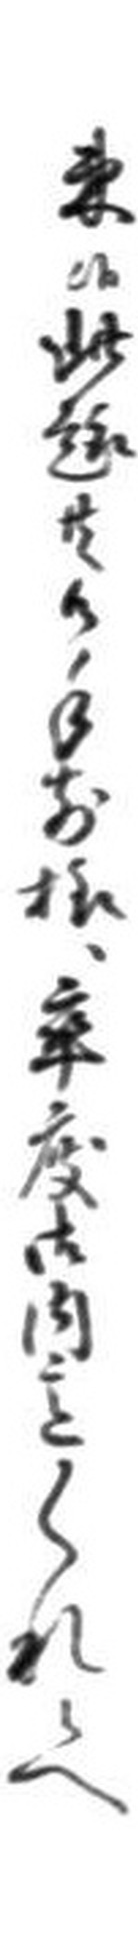束候此趣共御手前様へ卒度御内意くれ候へ
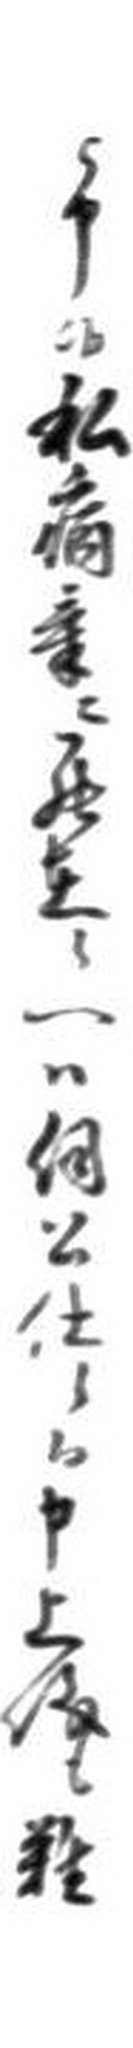与申候私病気ニ罷在候へハ伺公仕候而申上儀も難
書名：家譜 二十一 吉品公 従元禄十三年到同十四年
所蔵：福井県文書館 Fukui Prefectural Archives
